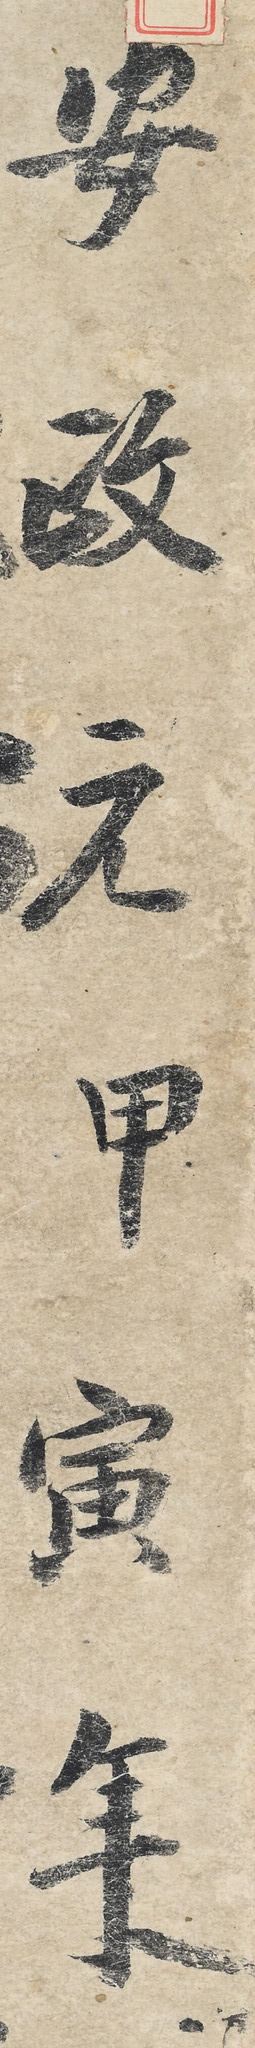安政元甲寅年
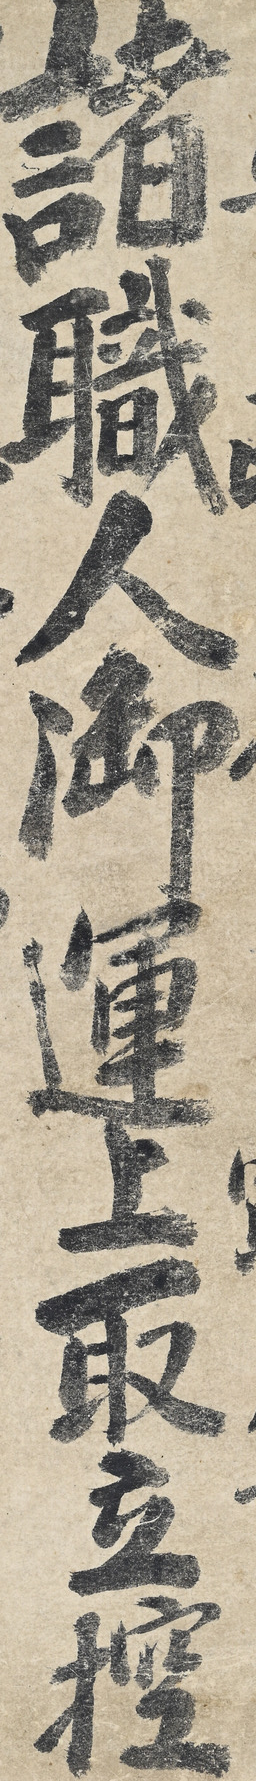諸職人御運上取立控
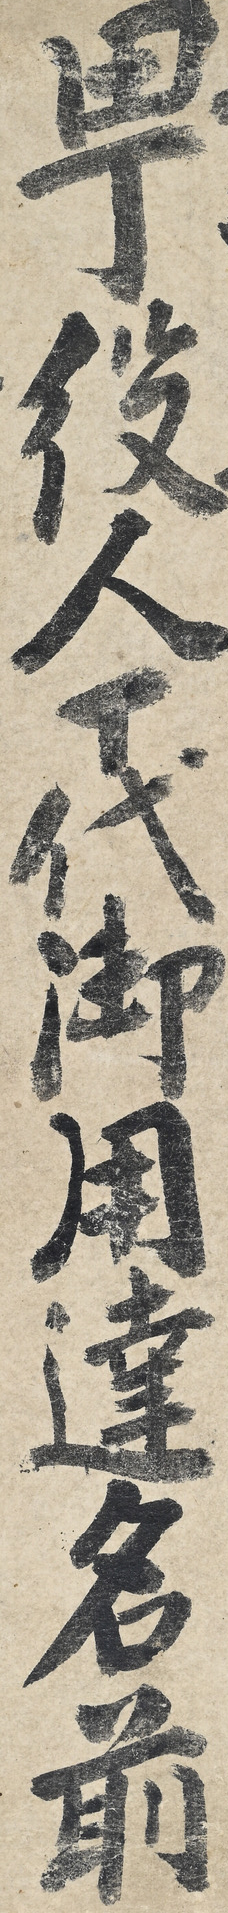町役人丁代御用達名前
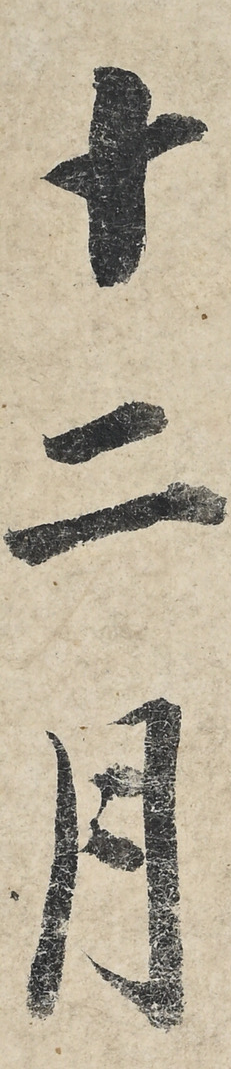十二月
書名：諸職人御運上取立控・町役人丁代御用達名前書
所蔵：伊那市立高遠町図書館・合同会社AMANE
